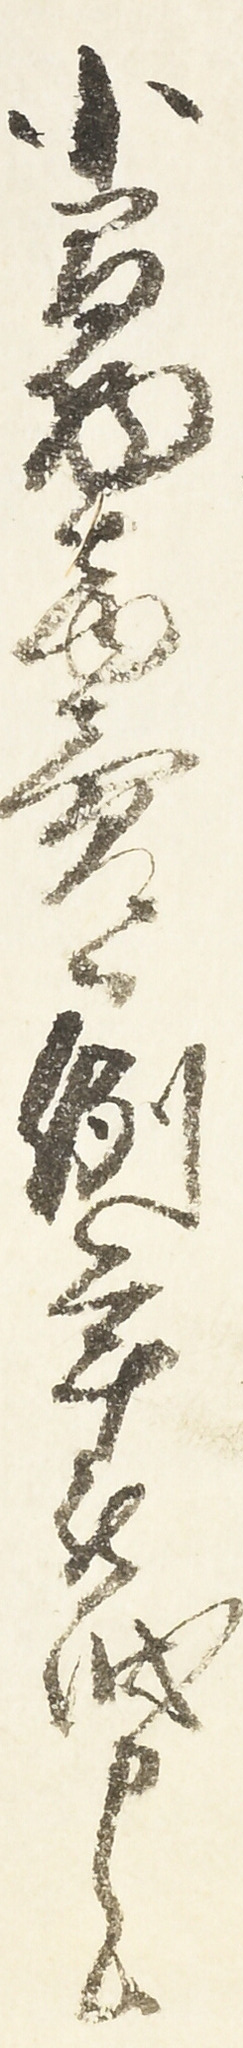小間物商売ニ而例年罷越申候
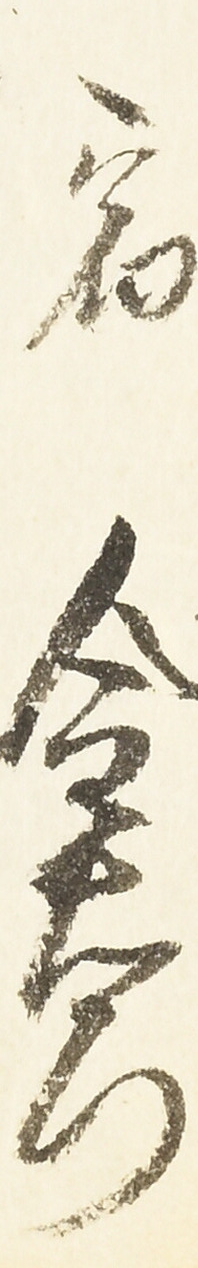宿金右衛門
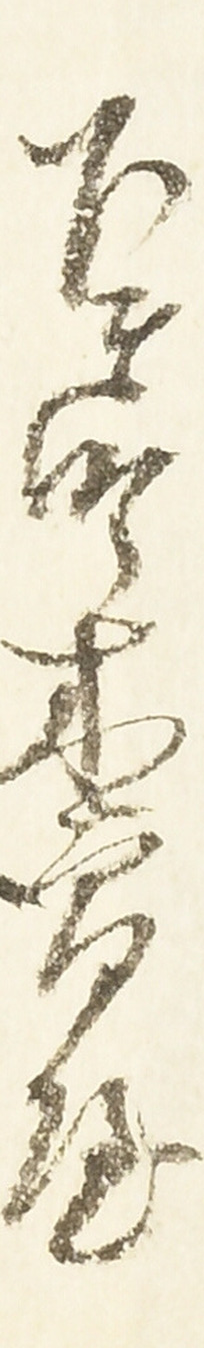下モ町木曽屋
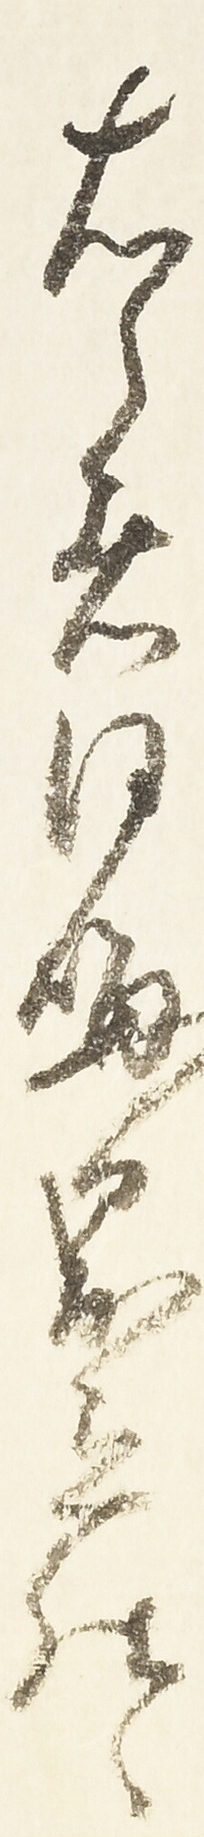右之者同晦日出立仕候
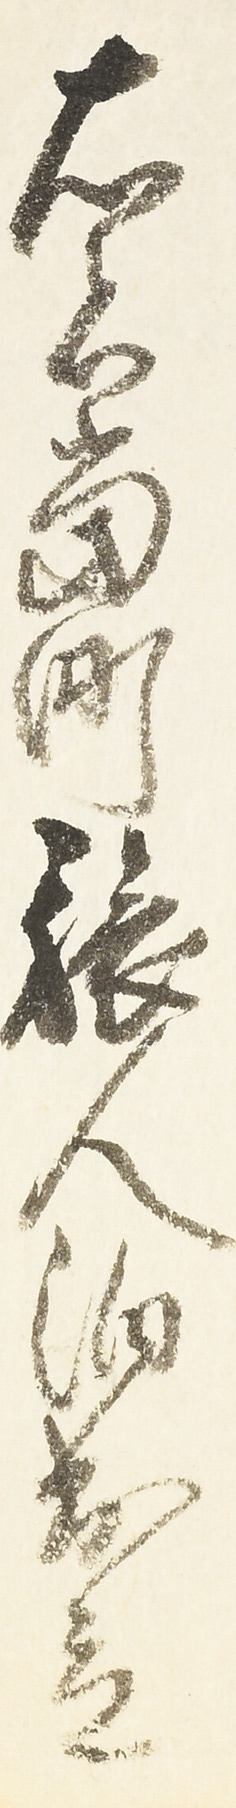右者当町旅人泊出立
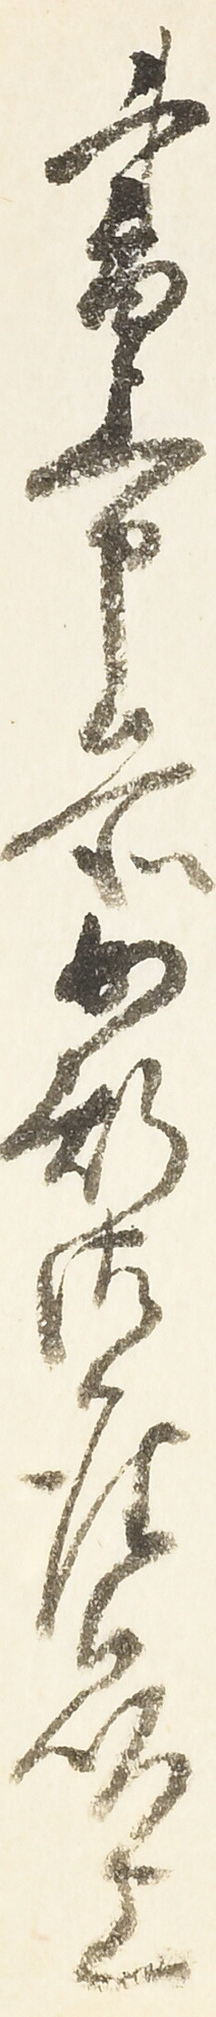書上申候所如斯御座候以上
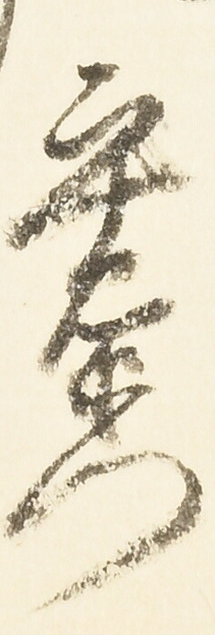平右衛門
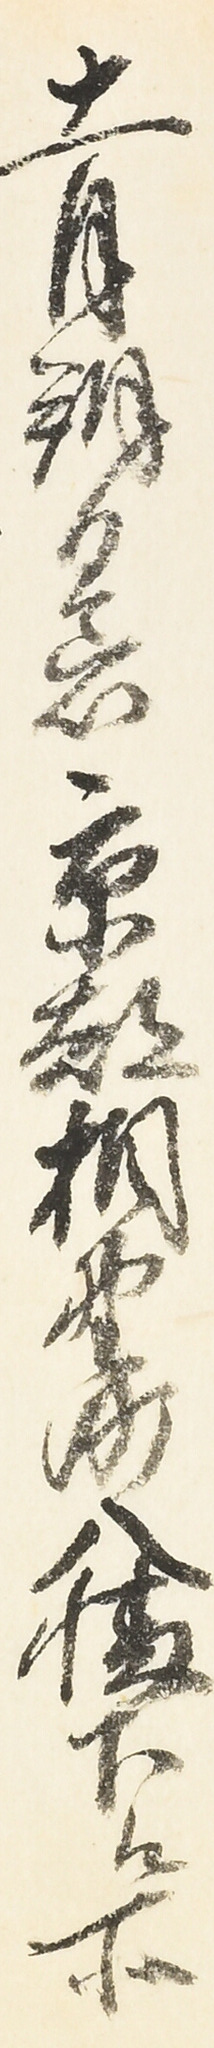十一月朔日着京都相野町八幡下ル所
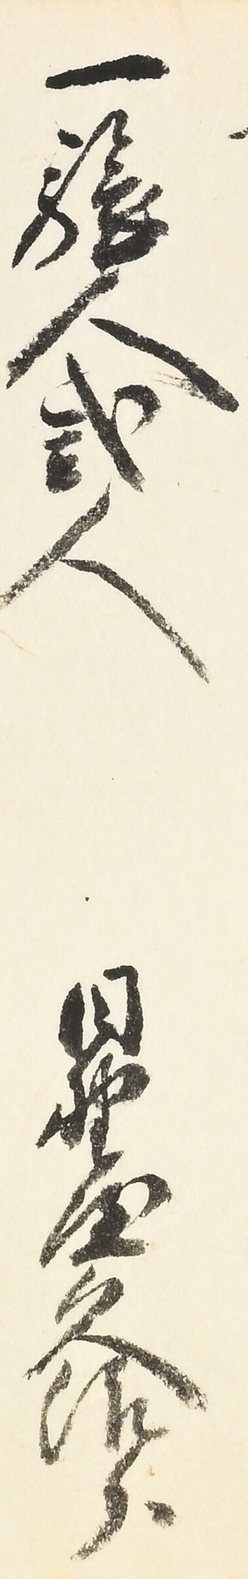一旅人弐人日野屋久治郎
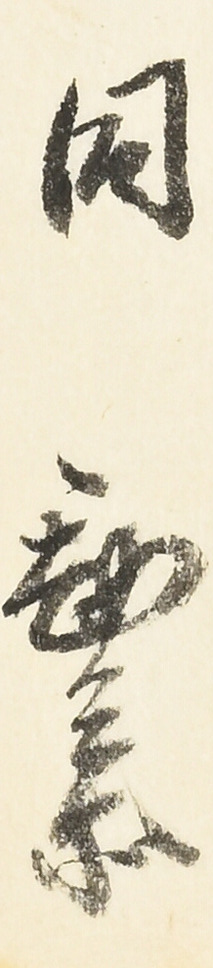同勘兵衛
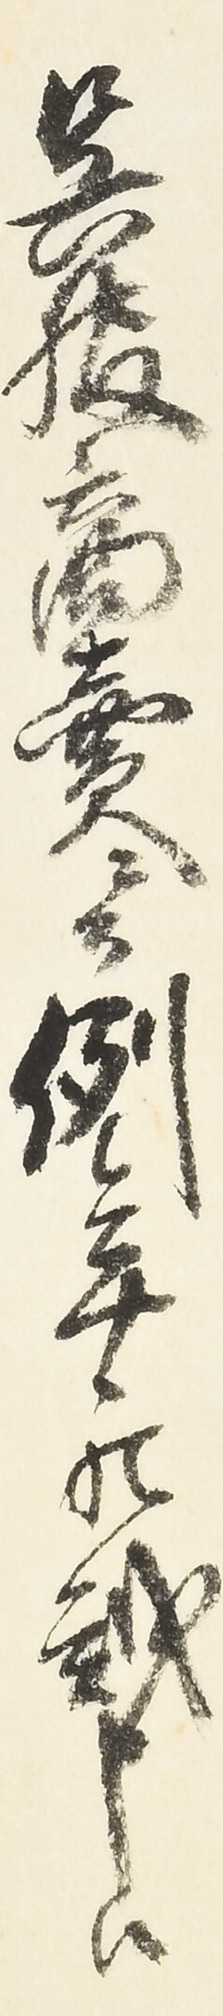呉服商売ニ而例年罷越申候
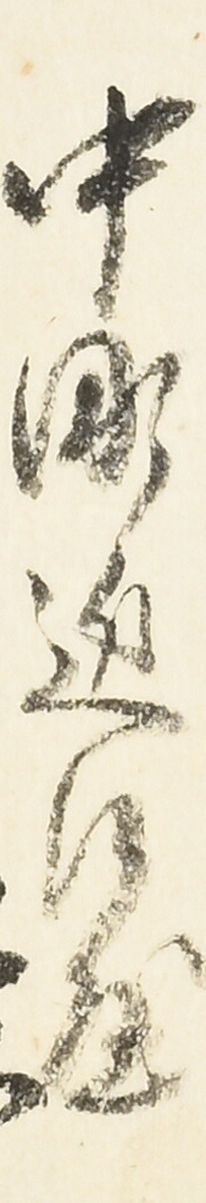中町近江屋
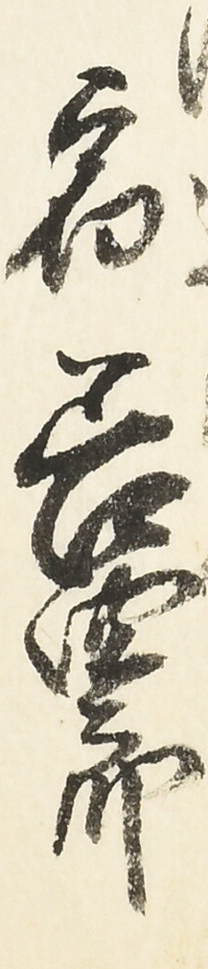宿善四郎
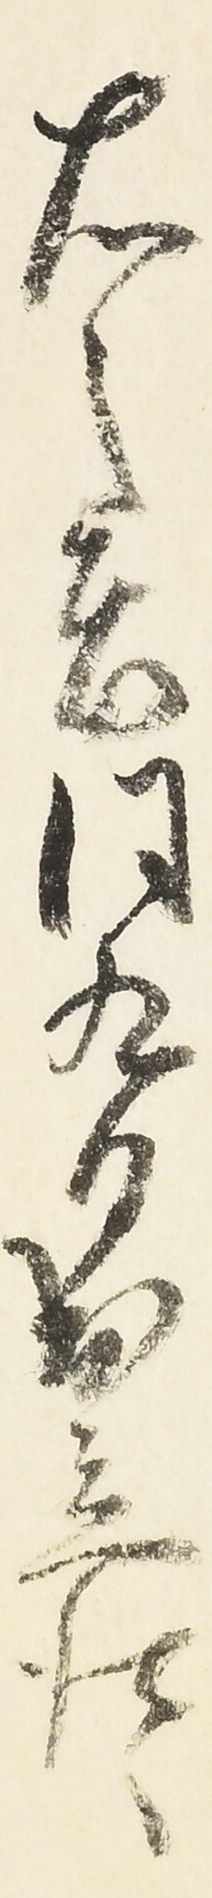右之者同九日出立仕候

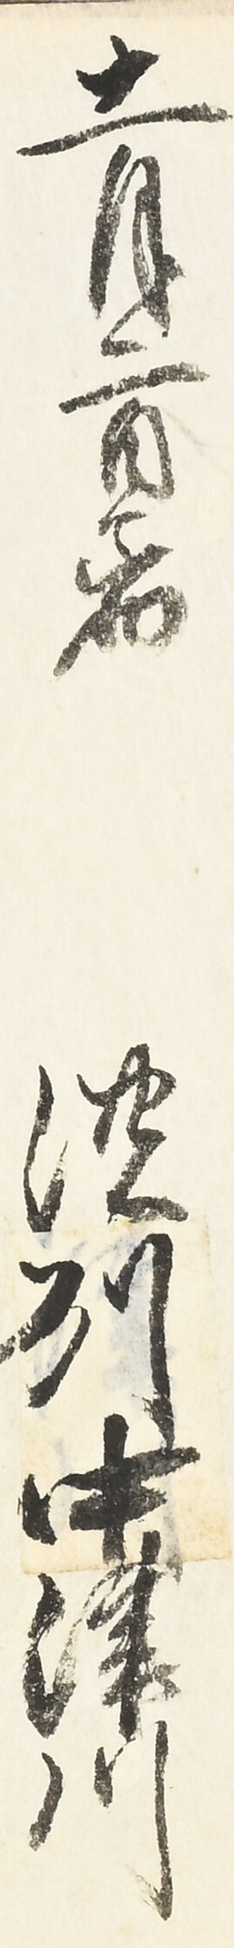十一月二日着濃州中津川
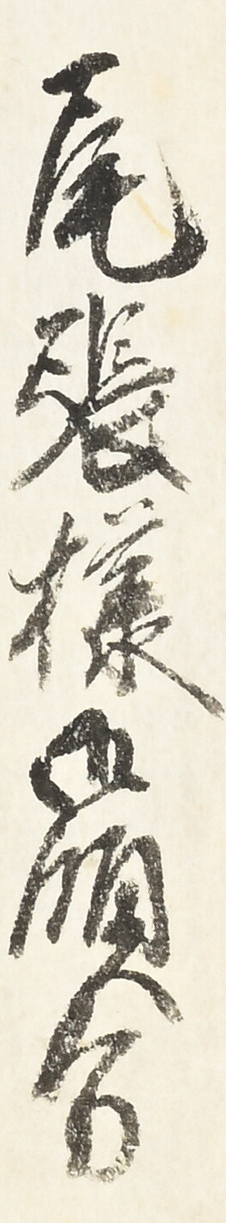尾張様御領分
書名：町中旅人泊控帳
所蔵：伊那市立高遠町図書館・合同会社AMANE
